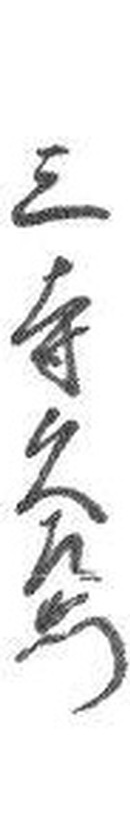三寺久左衛門
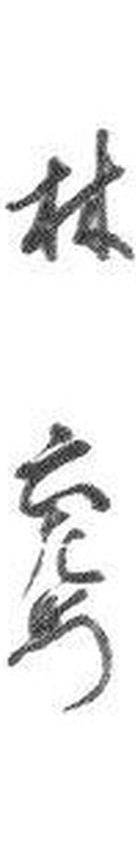林六左衛門
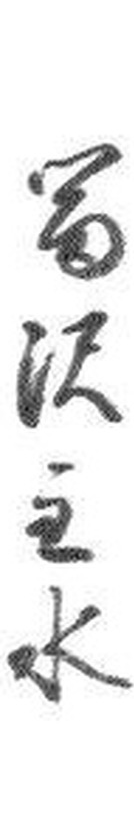留沢主水
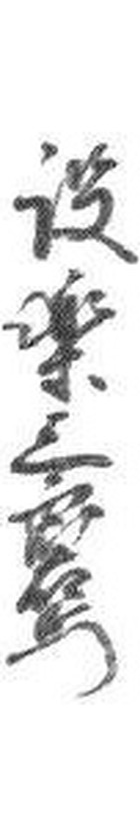設楽三郎右衛門
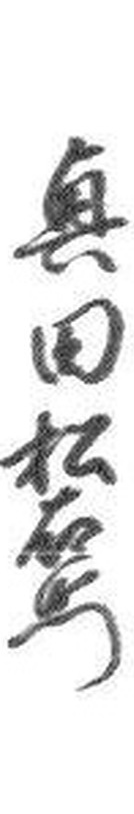奥田松右衛門
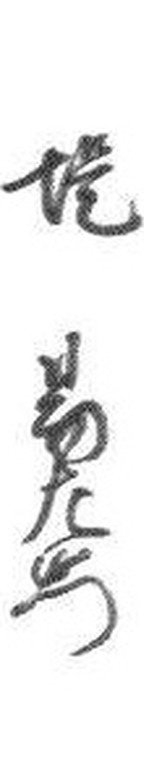堤易左衛門
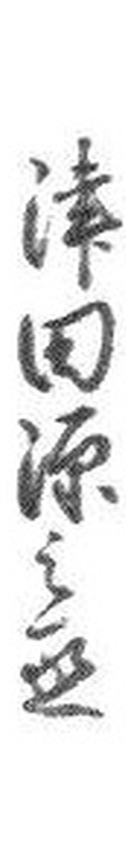津田源之丞
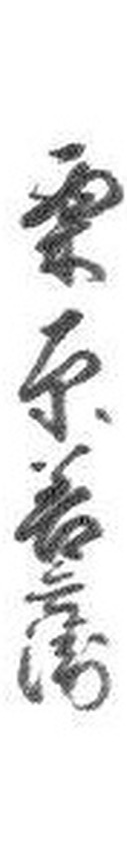栗原善兵衛
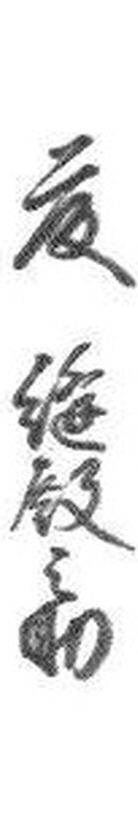藤縫殿之助

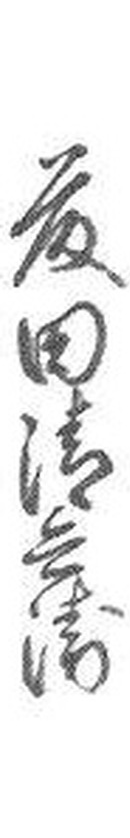藤田清兵衛
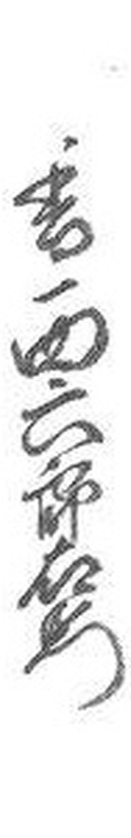香西六郎右衛門
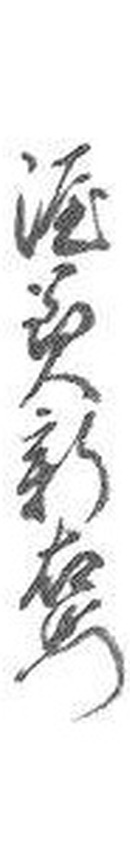渥美新右衛門
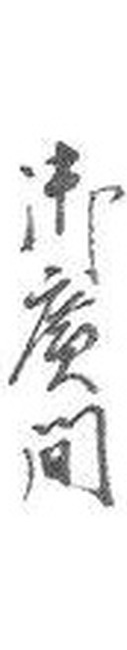御広間
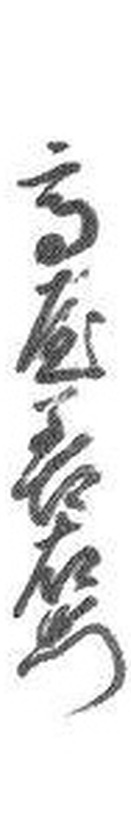高屋善右衛門
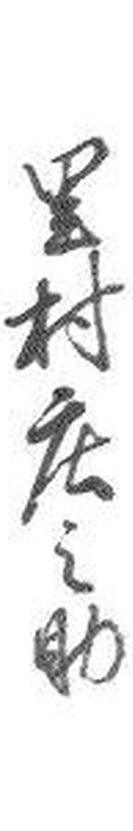里村庄之助
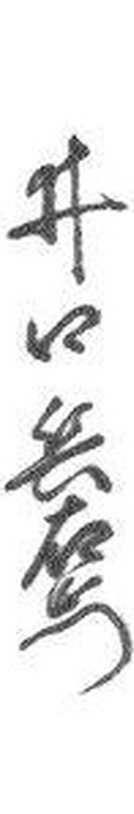井口兵右衛門
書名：家譜 四 忠昌公 従寛永七年到正保四年
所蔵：福井県文書館 Fukui Prefectural Archives
